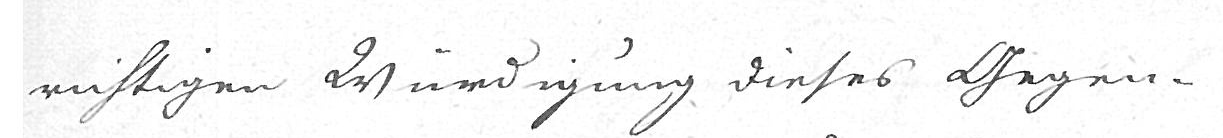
richtigen Würdigung dieses Gegen-
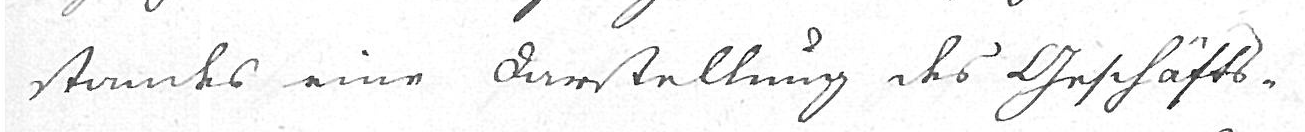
stands eine Darstellung des Geschäfts-
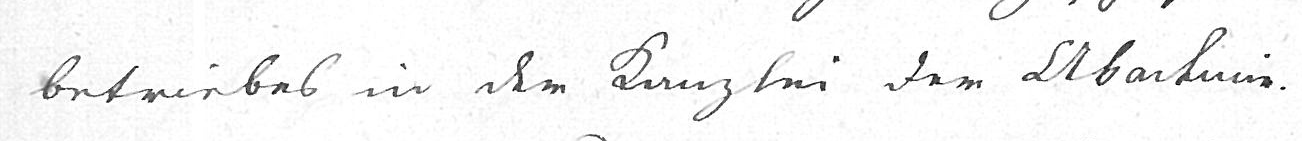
betriebes in der Kanzlei der Akademie.
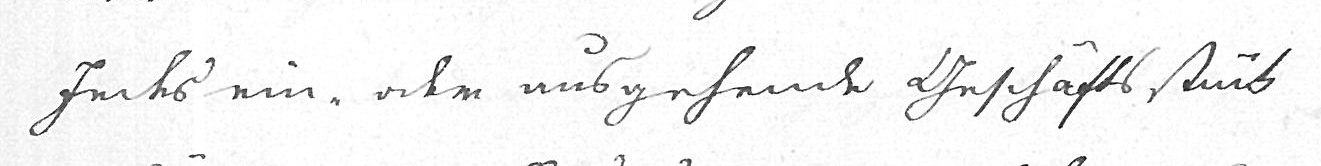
Jedes ein- oder ausgehende Geschäftsstück
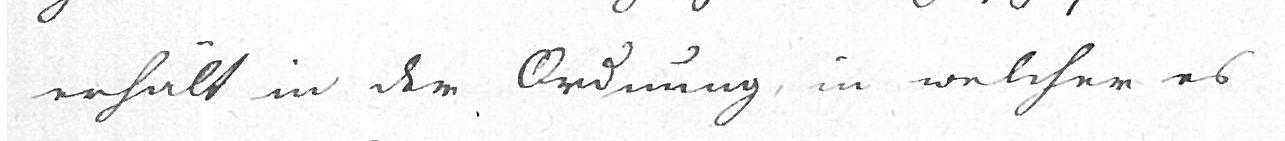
erhält in der Ordnung, in welcher es
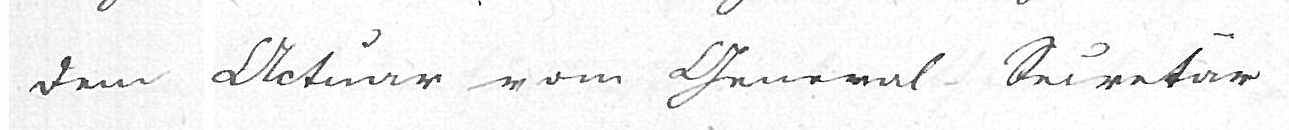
dem Actuar vom General-Secretär
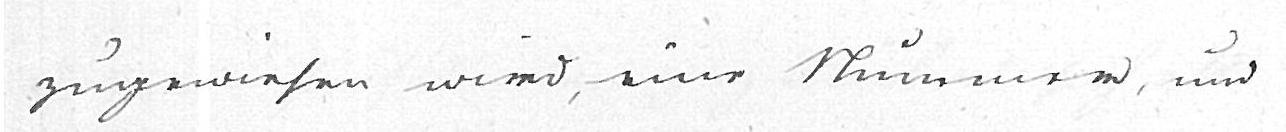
zugewiesen wird, eine Nummer, und
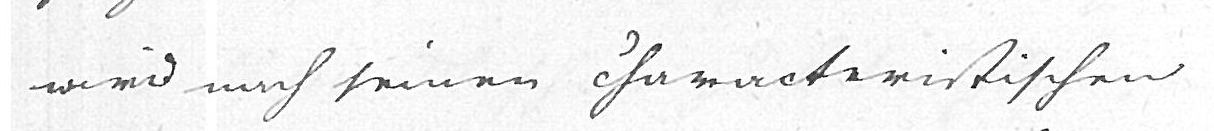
wird auch seinen characteristischen
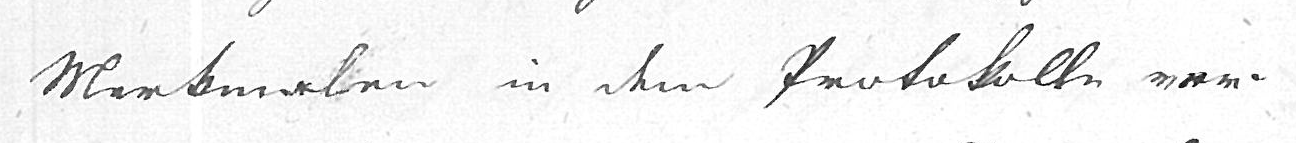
Merkmalen in dem Protokolle ver-
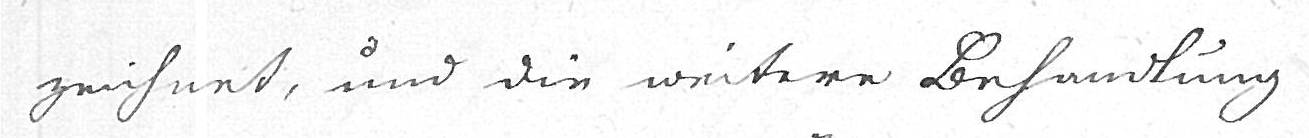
zeichnet, und die weitere Behandlung
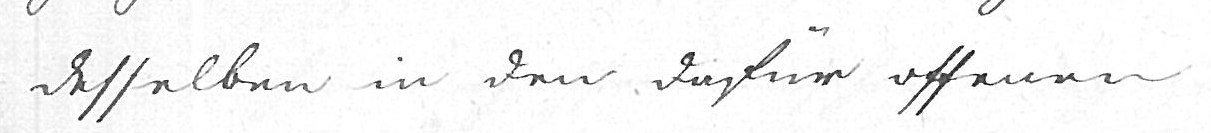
desselben in dem dafür offenen
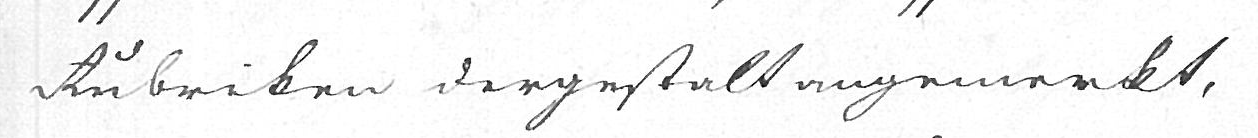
Rubriken dergestallt angemerkt,
